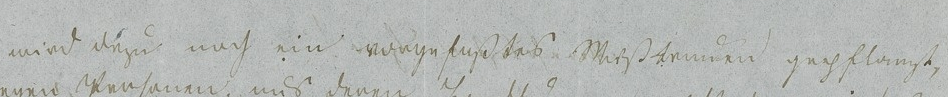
wird dazu noch ein vorgefaßtes Mißtrauen gepflanzt,
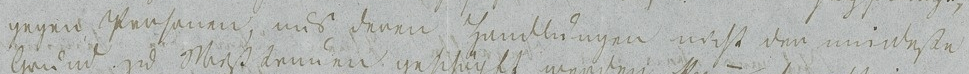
gegen Personen, aus deren Handlungen nicht der mindeste
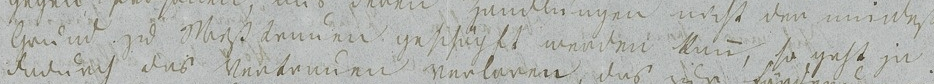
Grund zu Mißtrauen geschöpft werden kann, so geht ja
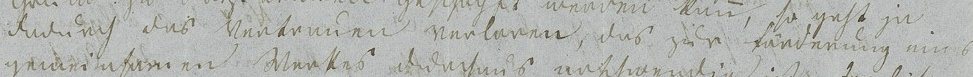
dadurch das Vertrauen verloren, das zur Förderung eines
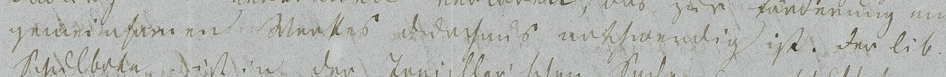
gemeinsamen Werkes durchaus nothwendig ist. Der lib.
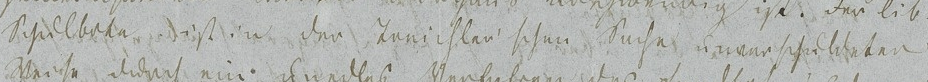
Schulbote ist in der Treichler'schen Sache unverschuldeter
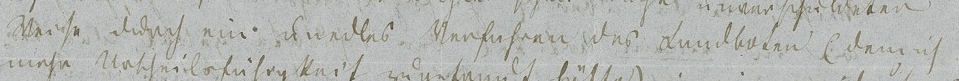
Weise durch ein unedles Verfahren des Landboten (dem ich
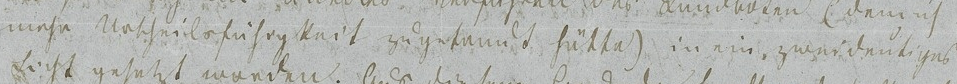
mehr Urtheilsfähigkeit zugetraut hätte) in ein zweideutiges
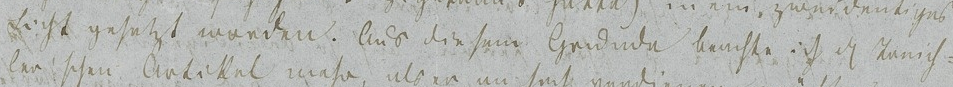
Licht gesetzt worden. Aus diesem Grunde beachte ich den Treich-
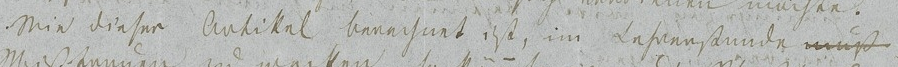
Wie dieser Artikel berechnet ist, im Lehrerstande muß
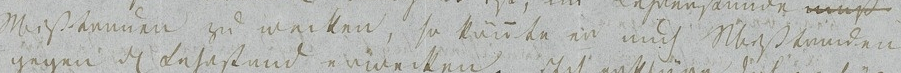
Mißtrauen zu wecken, so könnte er auch Mißtrauen
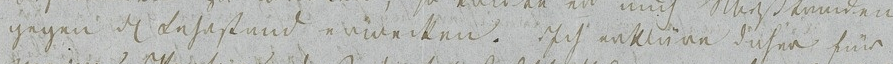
gegen den Lehrstand erwecken. Ich erkläre daher für
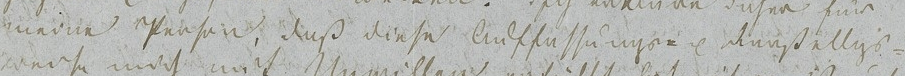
meine Person, daß diese Auffassungs- & Darstellungs-
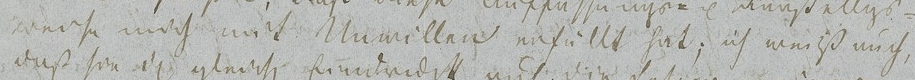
weise mich mit Unwillen erfüllt hat; ich weiß auch,
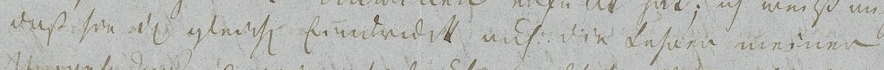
daß sie den gleichen Eindruck auf die Lehrer meiner
